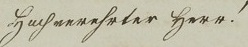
Hochverehrter Herr!
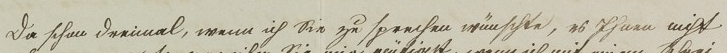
Da schon dreimal, wenn ich Sie zu sprechen wünschte, es Ihnen nicht
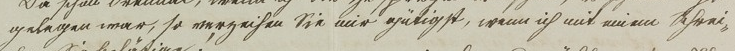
gelegen war, so verzeihen Sie mir gütigst, wenn ich mit meinem Schrei-
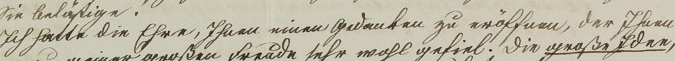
Ich hatte die Ehre, Ihnen einen Gedanken zu eröffnen, der Ihnen
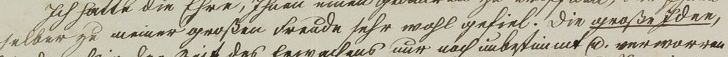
selber zu meiner großen Freude sehr wohl gefiel. Die große Idee,
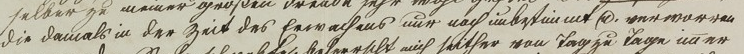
die damals in der Zeit des Erwachens nur noch unbestimmt &. verworren
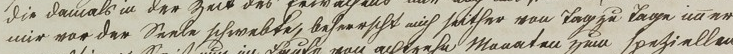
mir vor der Seele schwebte, beherrscht mich seither von Tag zu Tage immer
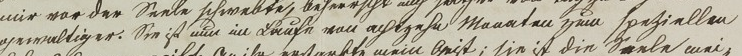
gewaltiger. Sie ist nun im Laufe von achtzehn Monaten zum speziellen
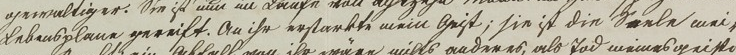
Lebensplane gereift. An ihr erstarkte mein Geist; sie ist die Seele mei-
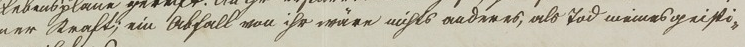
ner Kraft; ein Abfall von ihr wäre nichts anderes, als Tod meines geisti-
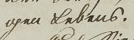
gen Lebens.
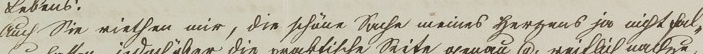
Auch Sie riethen mir, die schöne Sache meines Herzens ja nicht fal-
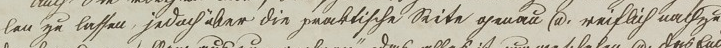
len zu lassen, jedoch über die praktische Seite genau &. reiflich nachzu-
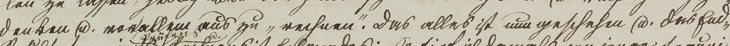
denken &. vorallem aus zu «rechnen». Das alles ist nun geschehen &. das End-
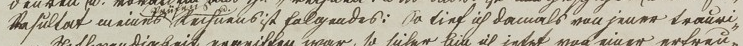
Resultat meines Prüfens &. Rechnens ist folgendes: So tief ich damals von jener trauri-
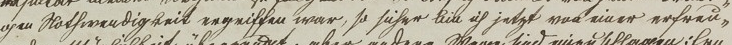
gen Nothwendigkeit ergriffen war, so sicher bin ich jetzt von einer erfreu-
